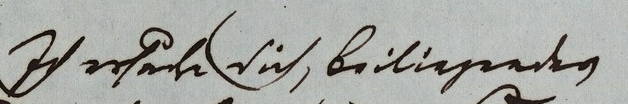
Ich ersuche dich, beiliegendes
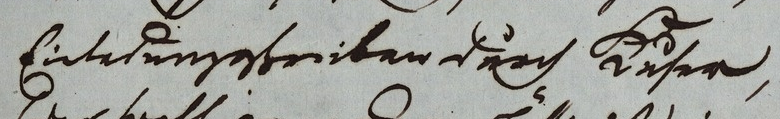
Einladungsschreiben durch Kuser,
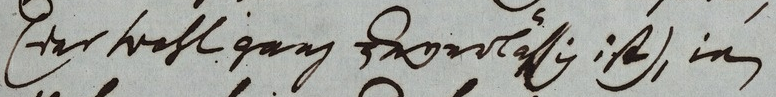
(der wohl ganz zuverlässig ist), in
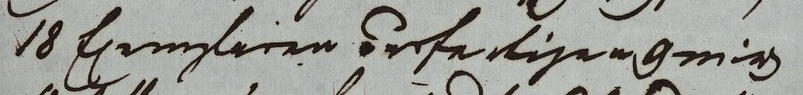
18 Exemplaren ausfertigen & mir
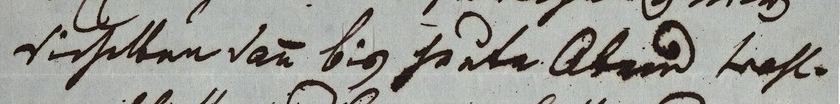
dieselben dann bis heute Abend wohl-
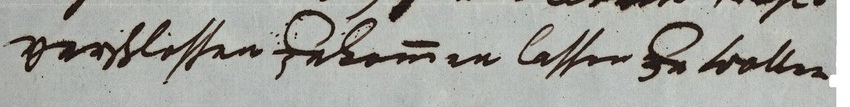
verschlossen zukommen lassen zu wollen.
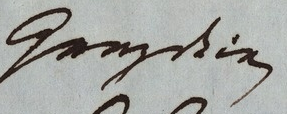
Ganz Dein
